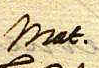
mat.
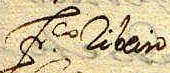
fr.co Ribeiro
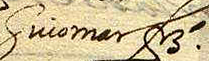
Guiomar frz̄.
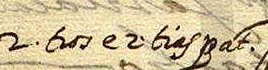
2. tios e 2. tias pāt.
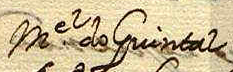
M.el do Quintal
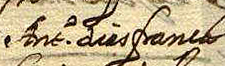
Ant.o dias frança
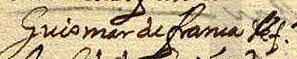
Guiomar de frança def.
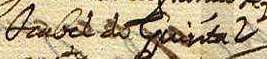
Izabel do Quintal
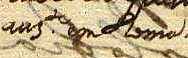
auz.te em Roma
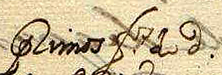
primos f.os do d.
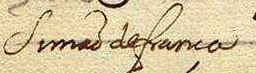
Simaõ de frança
